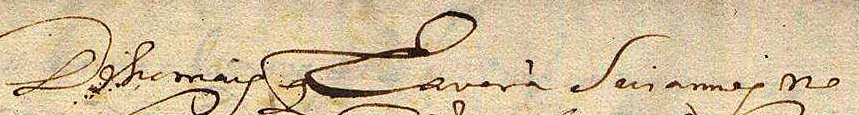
Disse mais q̄ haverá Seis annos no
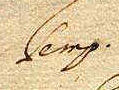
Temp.
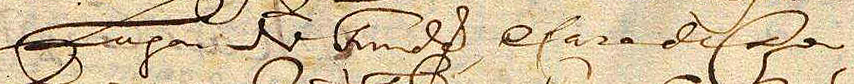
Lugar do Fundaõ e Caza de Do
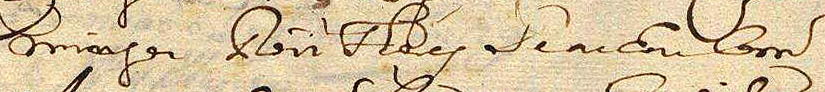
mingos Roiz̄ Flores se achou Com
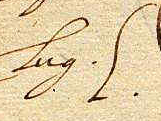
Lug. L.
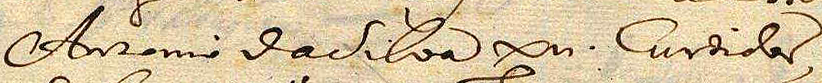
Antonio da Silva xn. Curtidor,
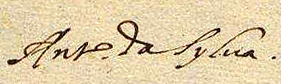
Anto da Sylua.
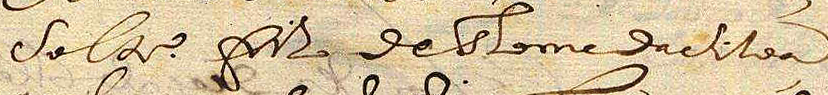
Soltr.o filho de Thome da Silva
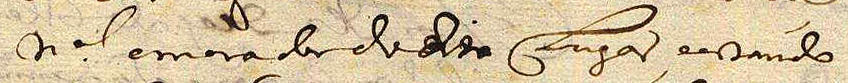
n.al e morador do dito Lugar, e estando
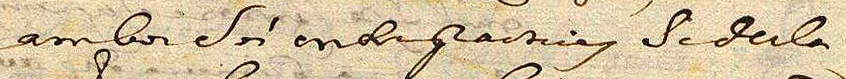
ambos Sós entre practicas Se decla
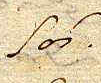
sós.
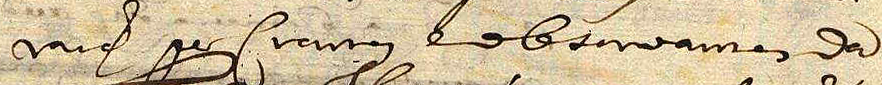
raraõ por Crentes e observantes da
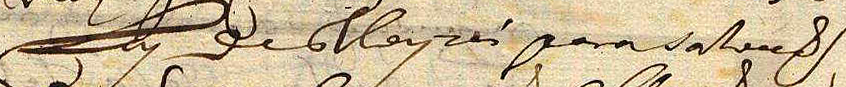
Ley de Moyzés para salvaçaõ
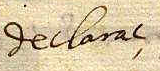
declaraç
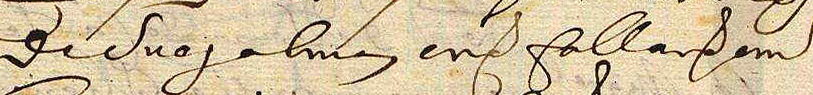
de Suas almas e naõ fallaraõ em
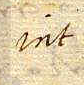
int
